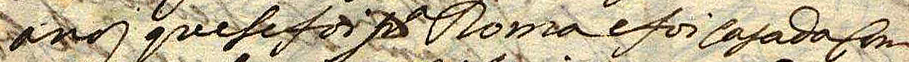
anos que se foi pa Roma e foi casada Com
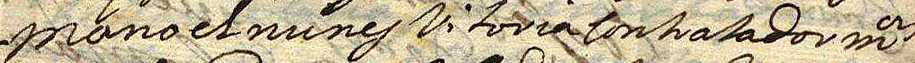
manoel nunes vitoria contratador mors
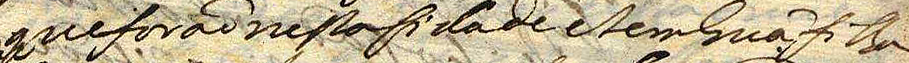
que foraõ nesta Cidade e tem huā filha
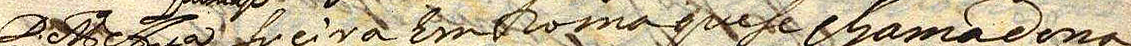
freira Em Roma que se chama dona
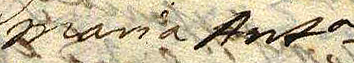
maria Anta
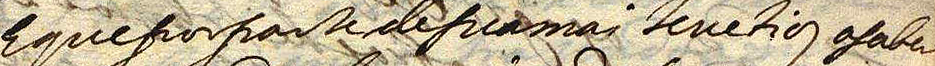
E que por parte de sua mai teue tios a saber
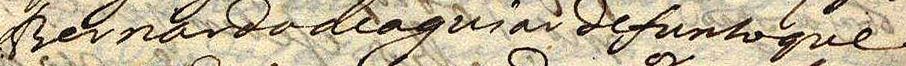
Bernardo de aguiar defunto que
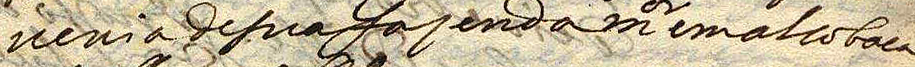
ueuia de sua fazenda mor em alcobaca
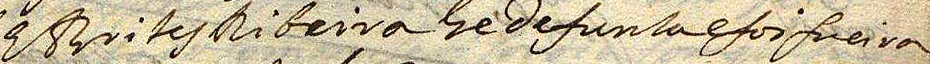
E Brites Ribeira he defunta e foi freira
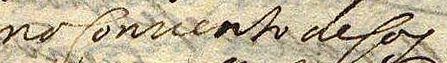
no Conuento de Cos
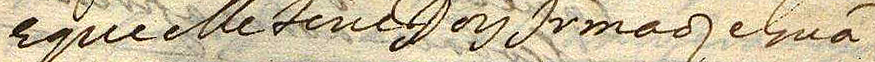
E que elle teue Dois Jrmaõs e huā
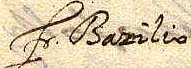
fr. Bazilio
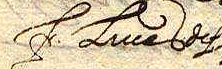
fr. Lucas def
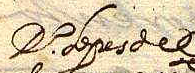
D.o Lopes de
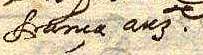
frança auz.te
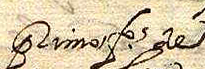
primos f.os de
